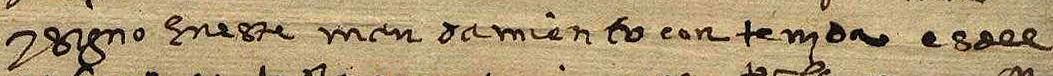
y signo E neste mandamiento contenjda es del
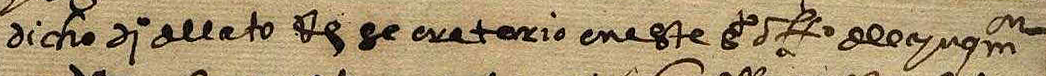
dicho djo delato & secretario en este sto offo dela jnquion
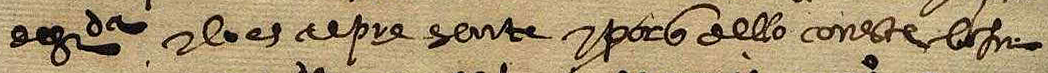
de grda y lo es de presente y porq̄ dello conste bo fee
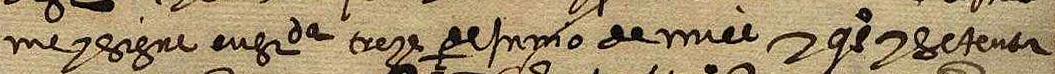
me y signe en grda treze de Junio de mill y qos y setenta
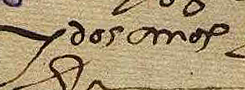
y dos anos
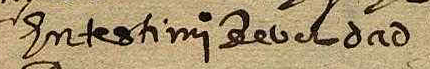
En testimjo de verdad
